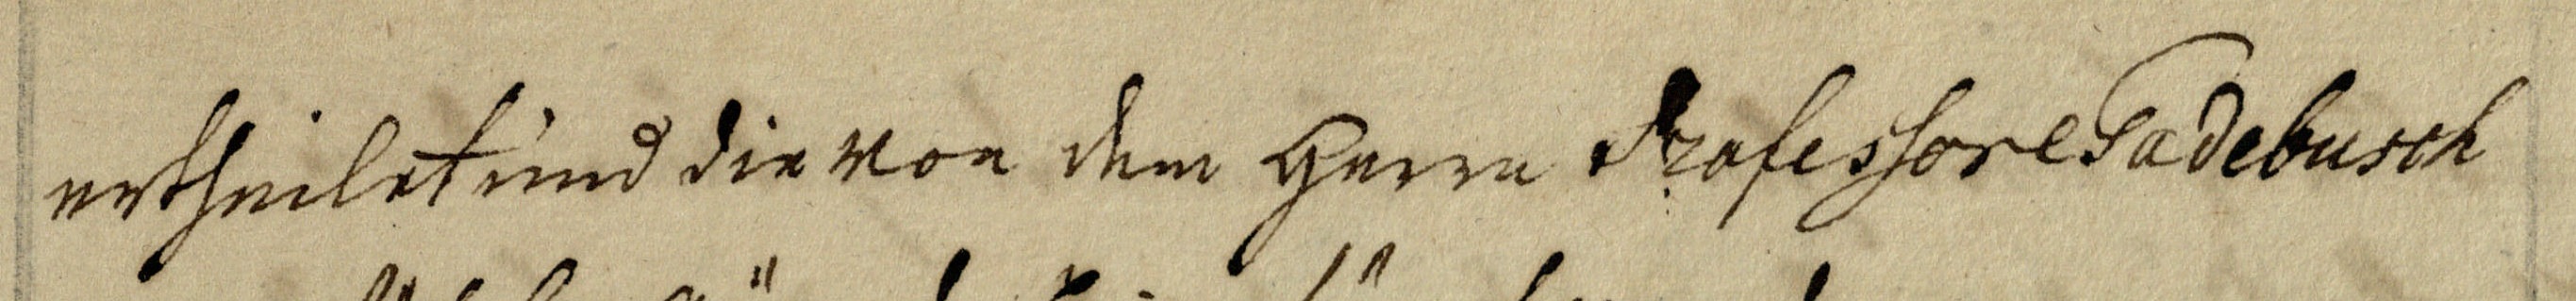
ertheilet und die von dem Herrn Professore Gadebusch
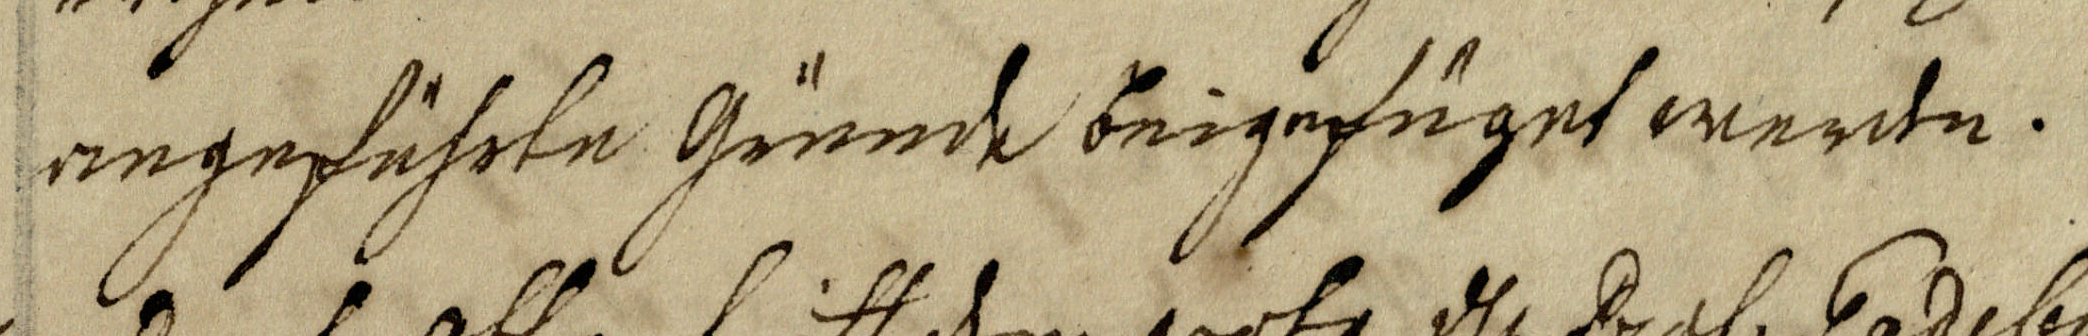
angeführte Gründe beigefüget werden.
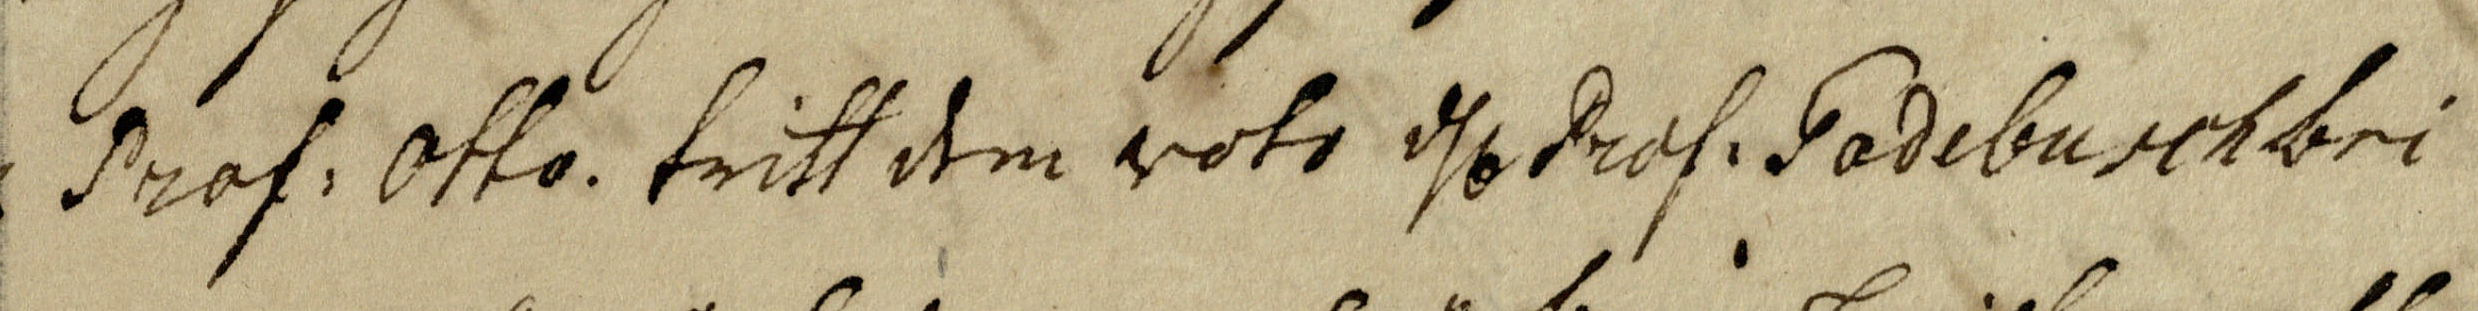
dh Prof. Otto nicht dem voto dh Prof. Gadebusch bei
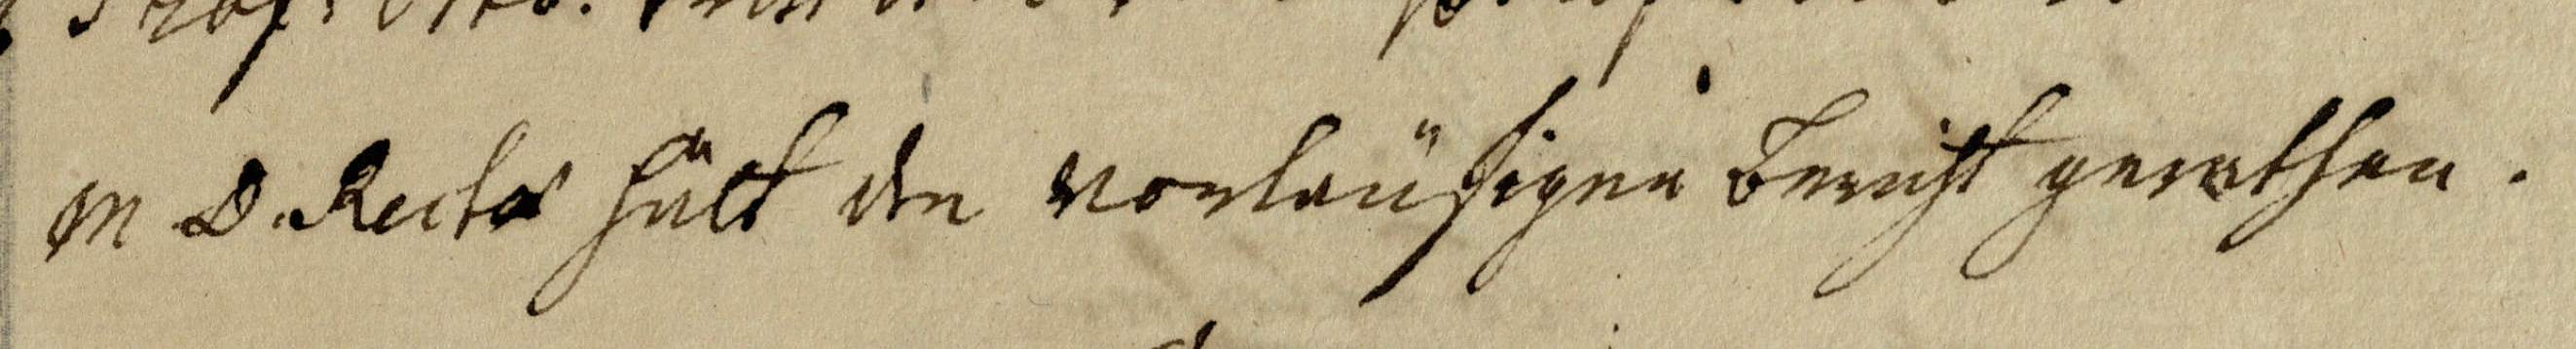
M. D. Rector hält den vorläufigen Bericht gerathen.
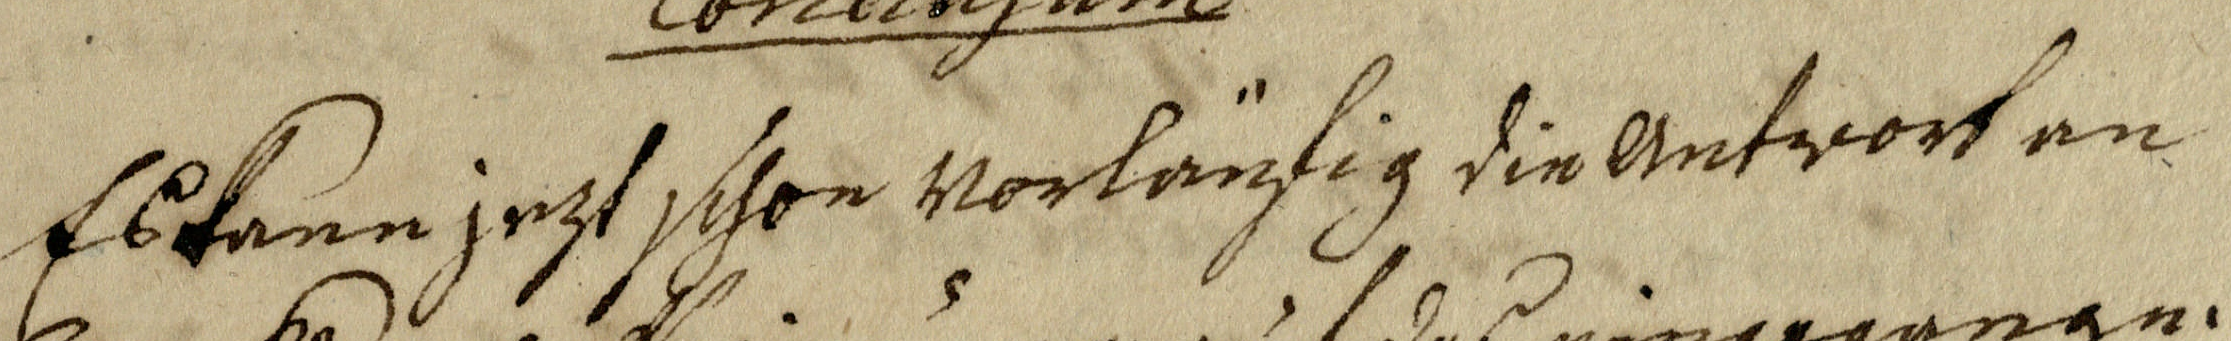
Es kann jezt schon vorläufig die Antwort an
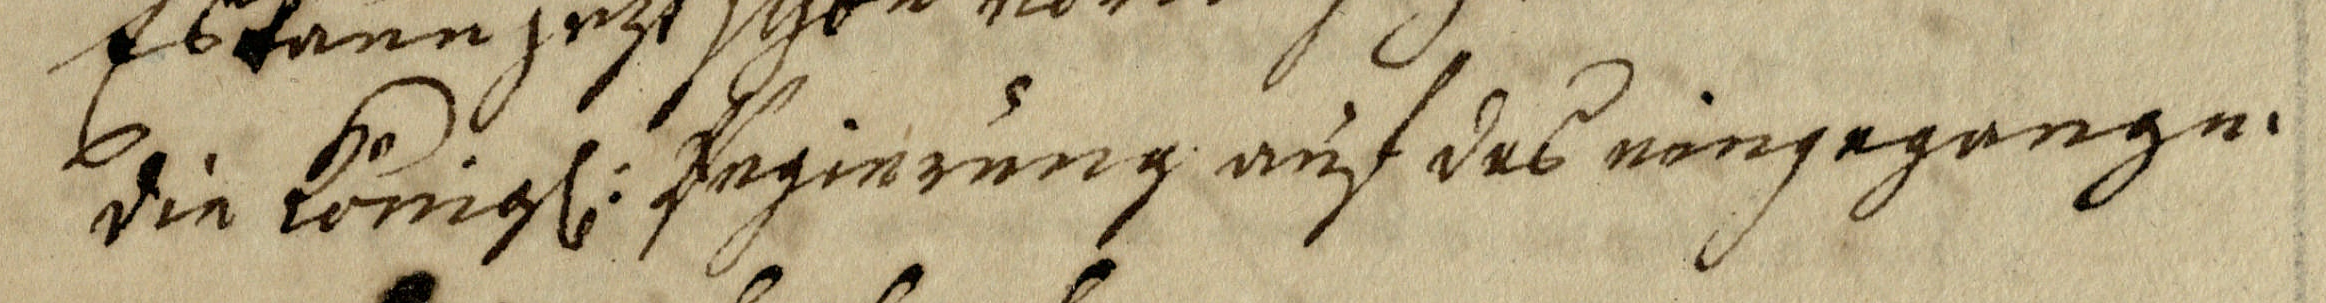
die Königl. Regierung auf das eingegange¬
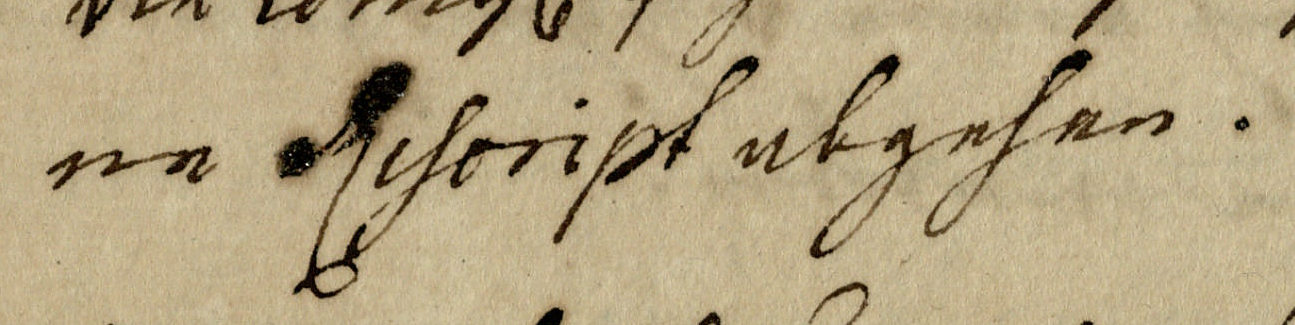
ne Rescript abgehen.
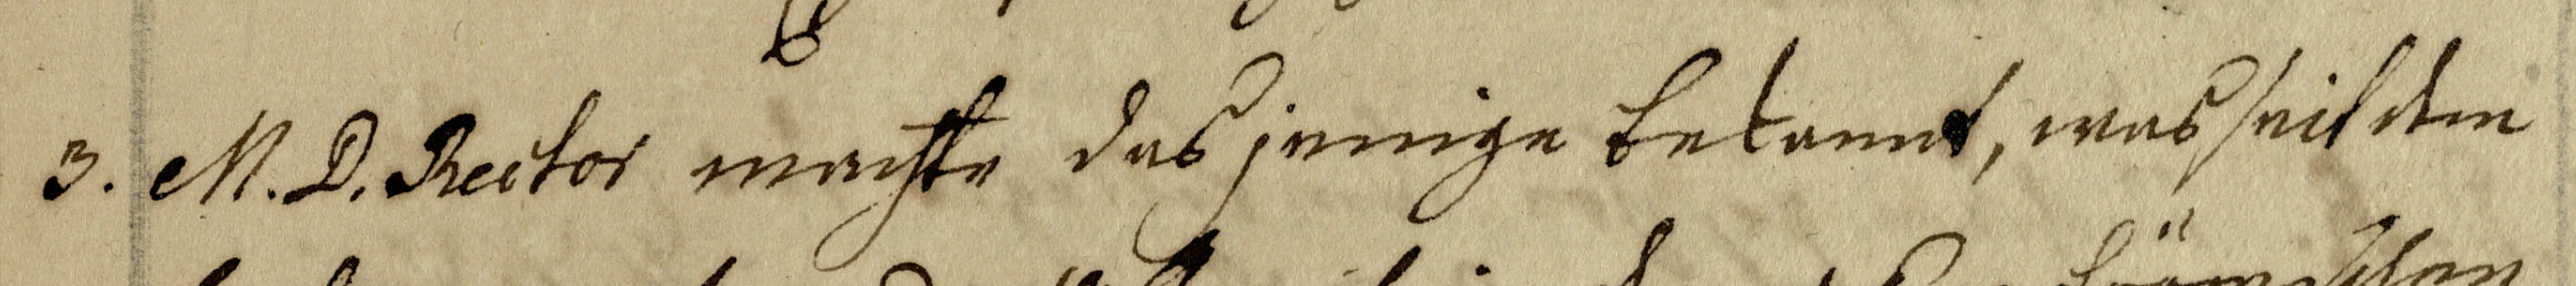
3. M. D. Rector machte das jenige bekannt, was seit dem
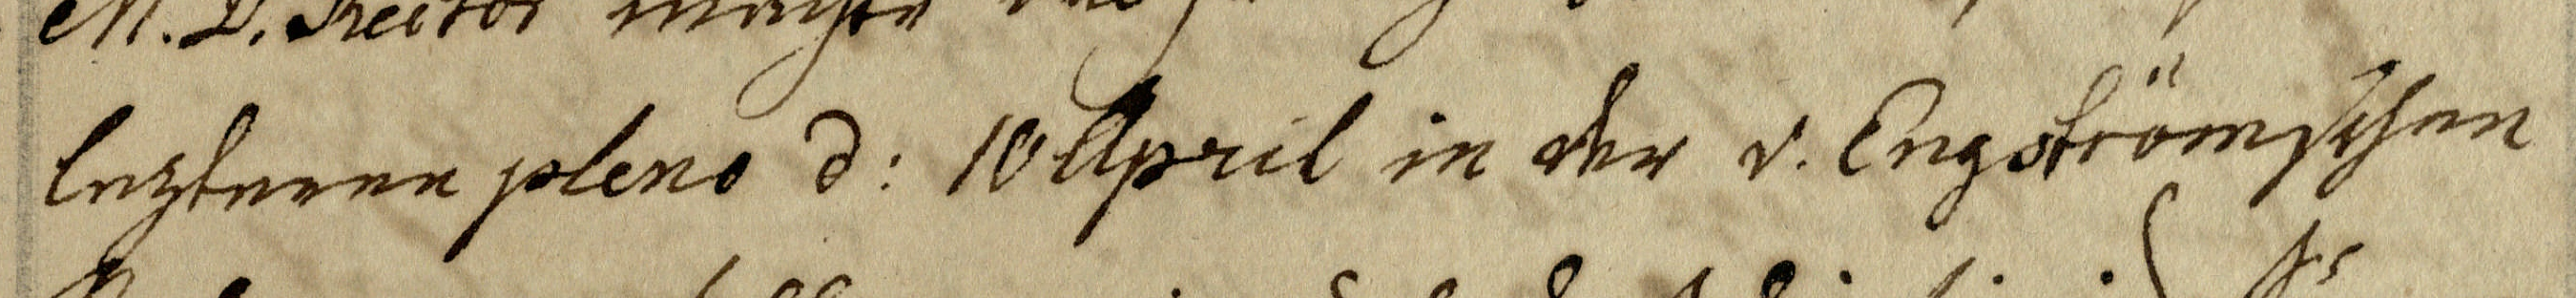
lezteren pleno d. 10. April in der v. Engströmschen
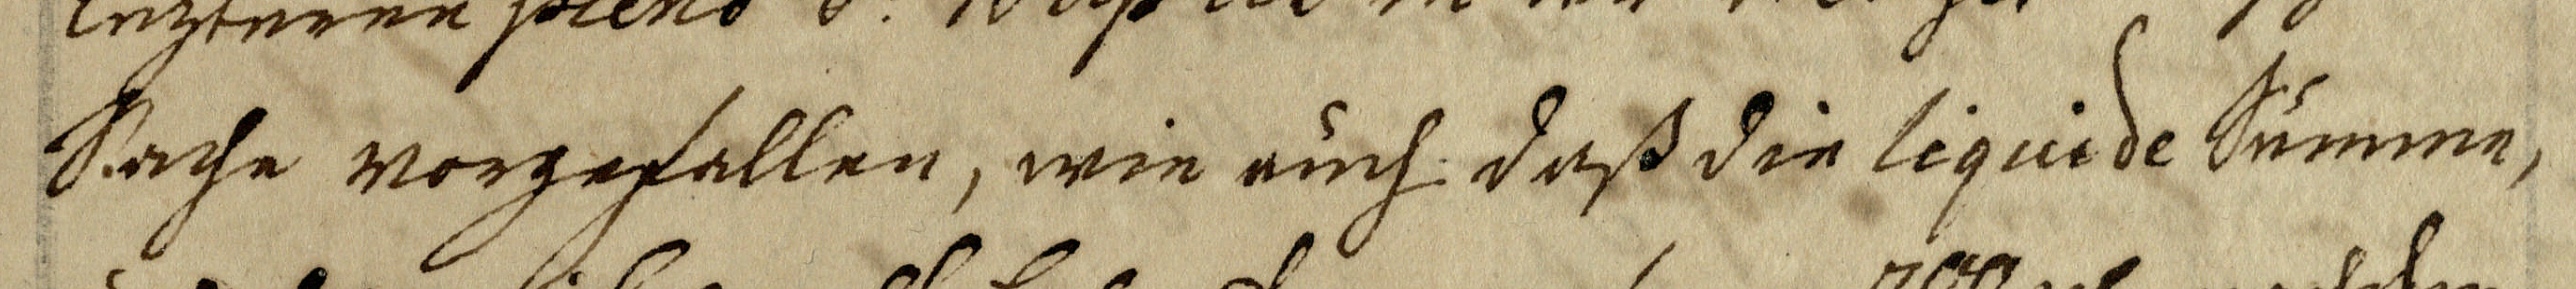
Sache vorgefallen, wie auch daß die liquide Summe,
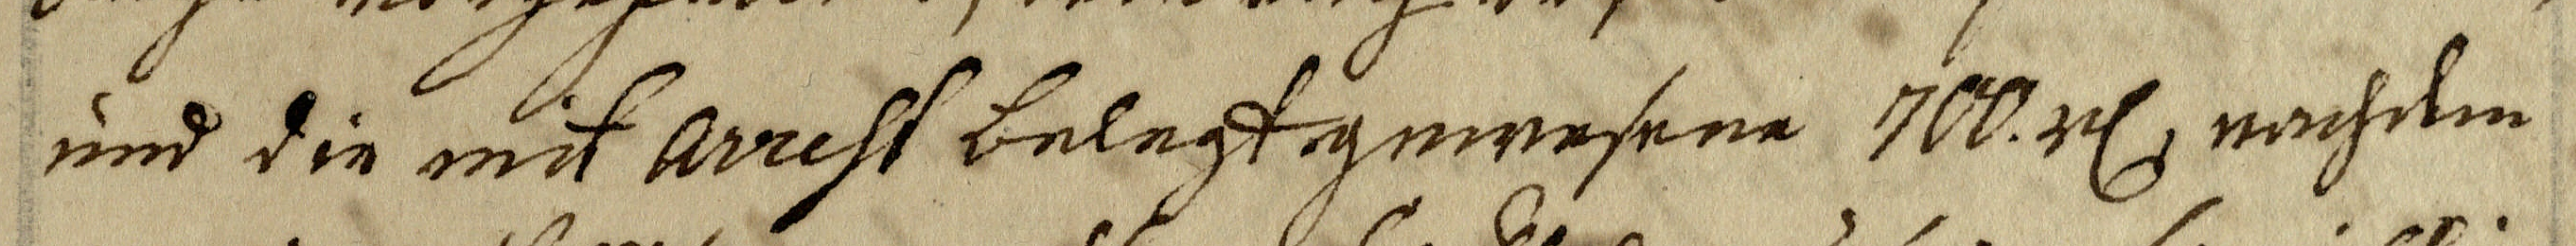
und die mit Arrest belegtgewesene 700. rl. nachdem
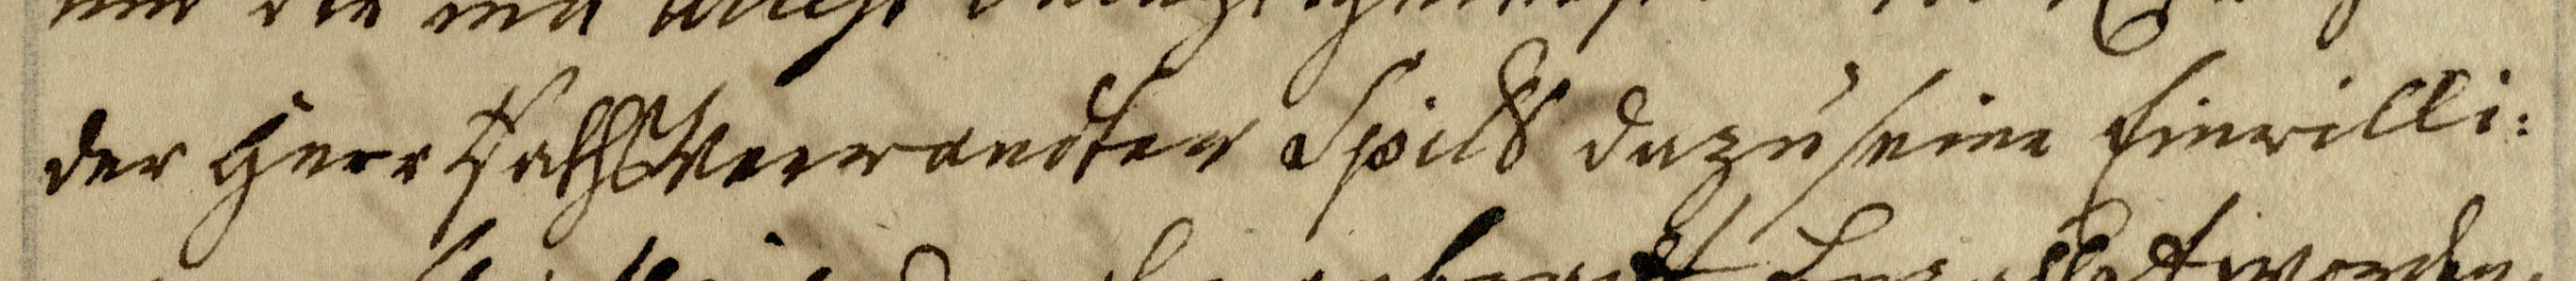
der Herr Rathsverwandter Spitt dazu seine Einwilli¬
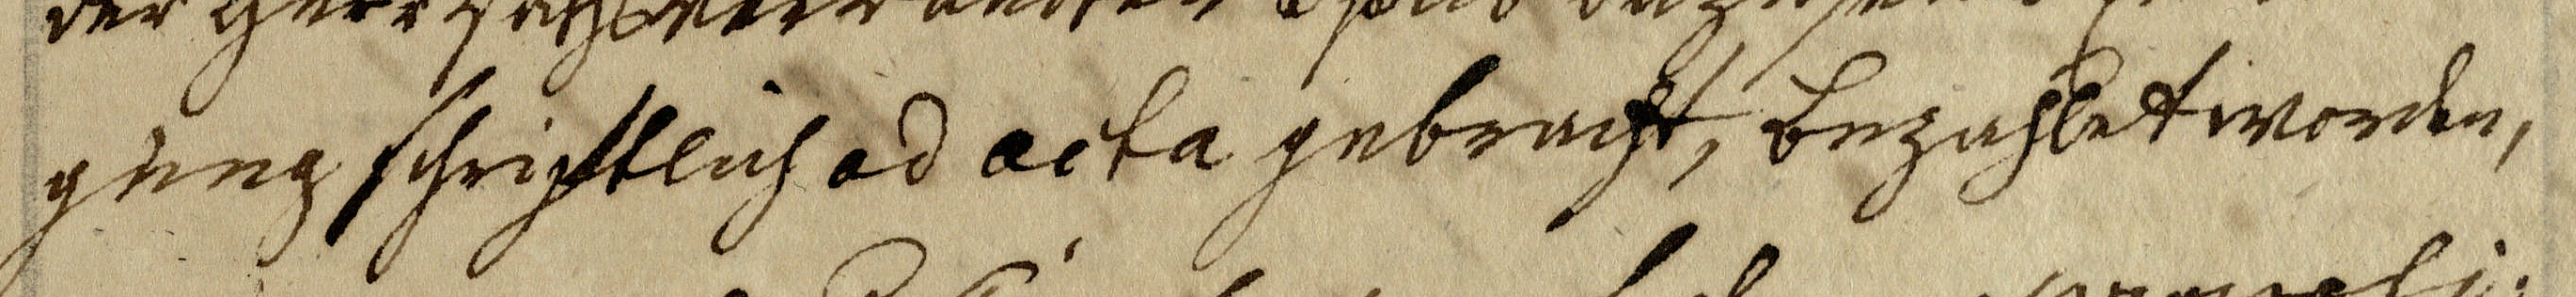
gung schriftlich ad acta gebracht, bezahlet worden,
